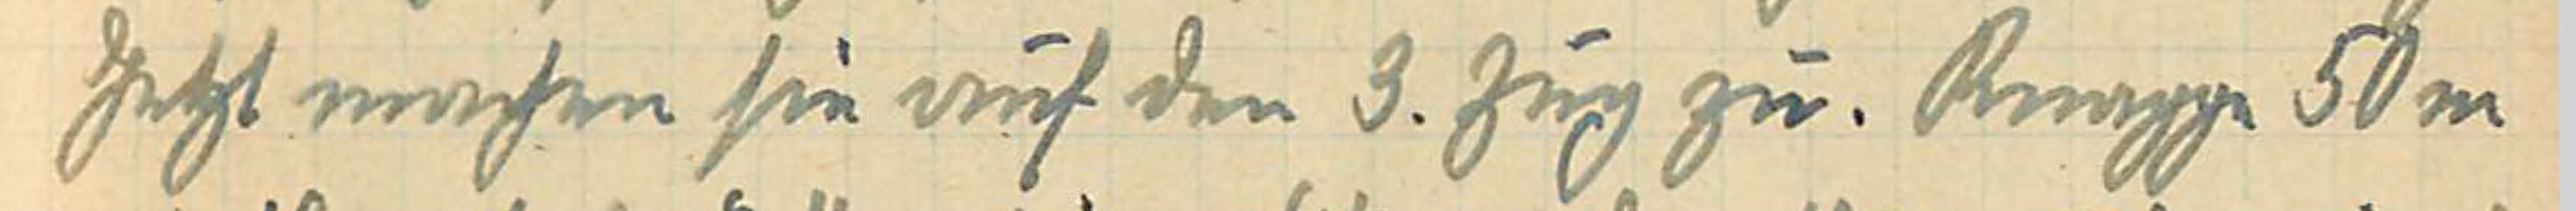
Jetzt machen sie auf den 3. Zug zu. Knappe 50 m
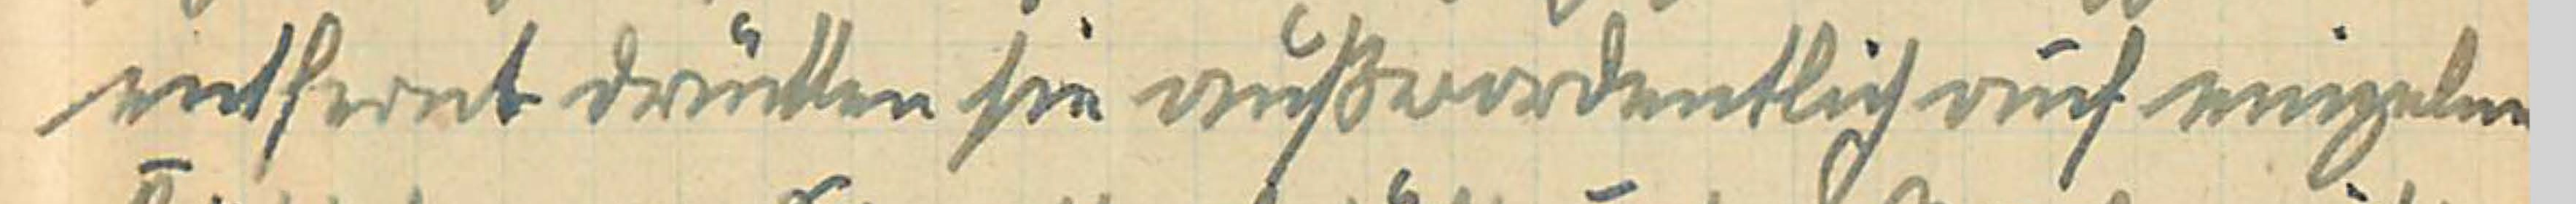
entfernt drückten sie außerordentlich auf einzelne
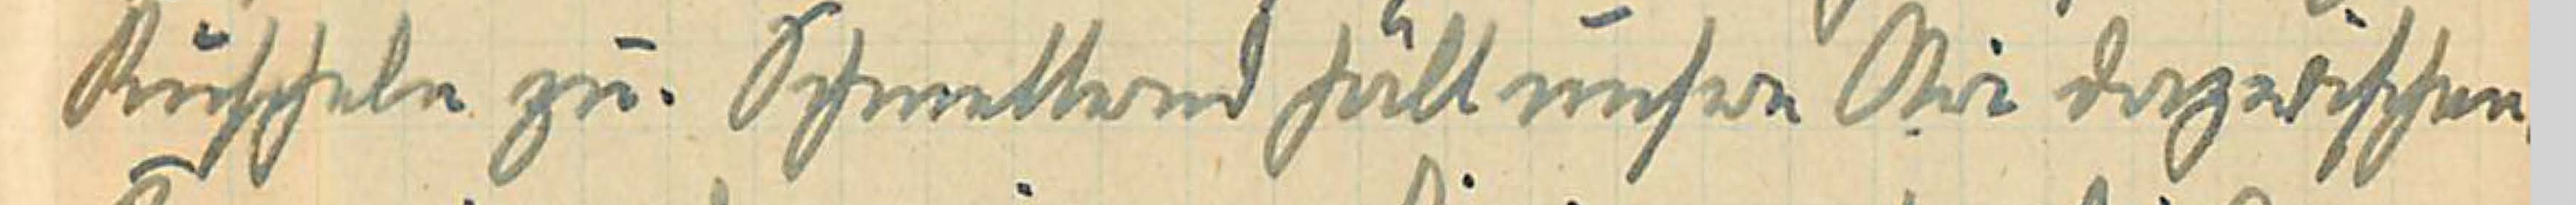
Kuscheln zu. Schmetternd hält unsere Ari dazwischen.
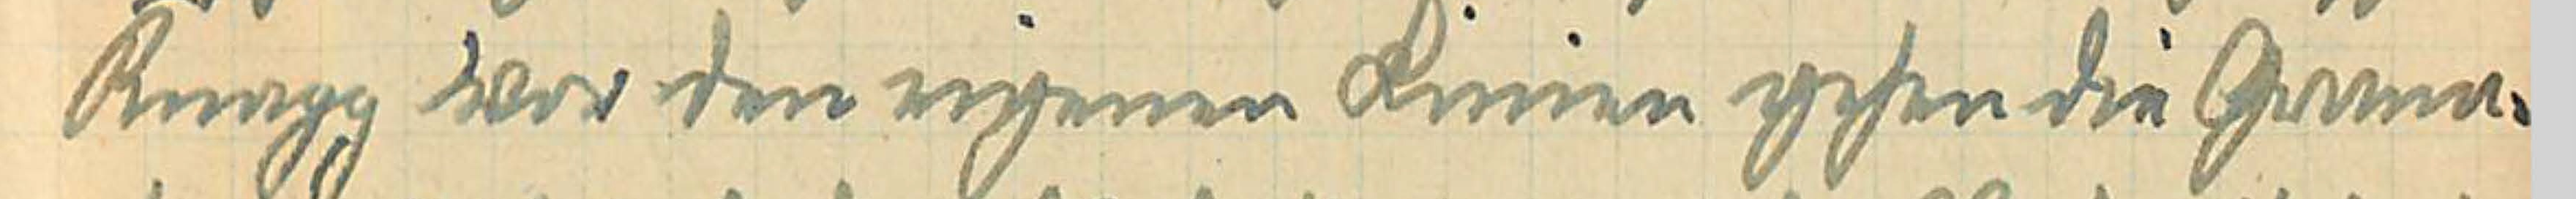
Knapp vor den eigenen Linien gehen die Grana-
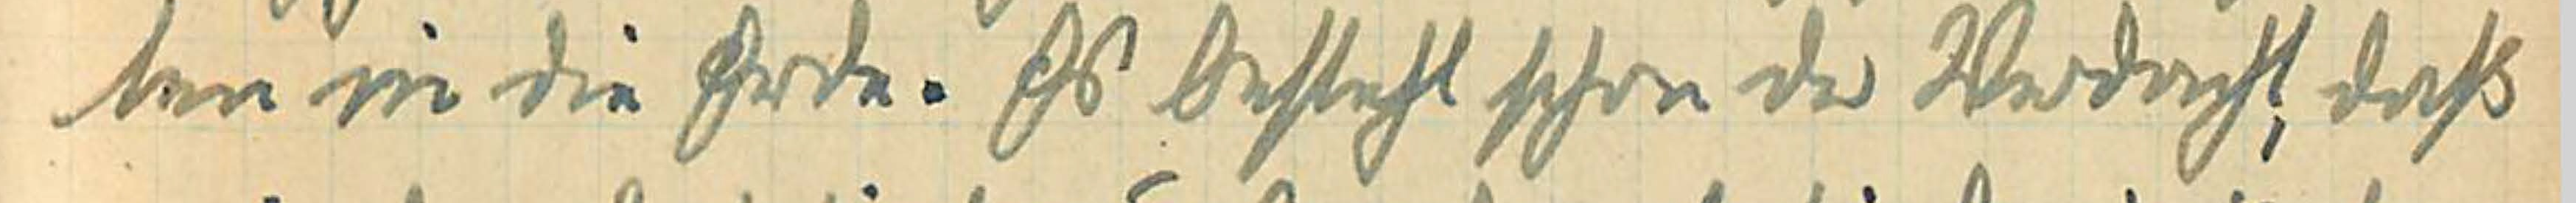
ten in die Erde. Es besteht schon der Verdacht, daß
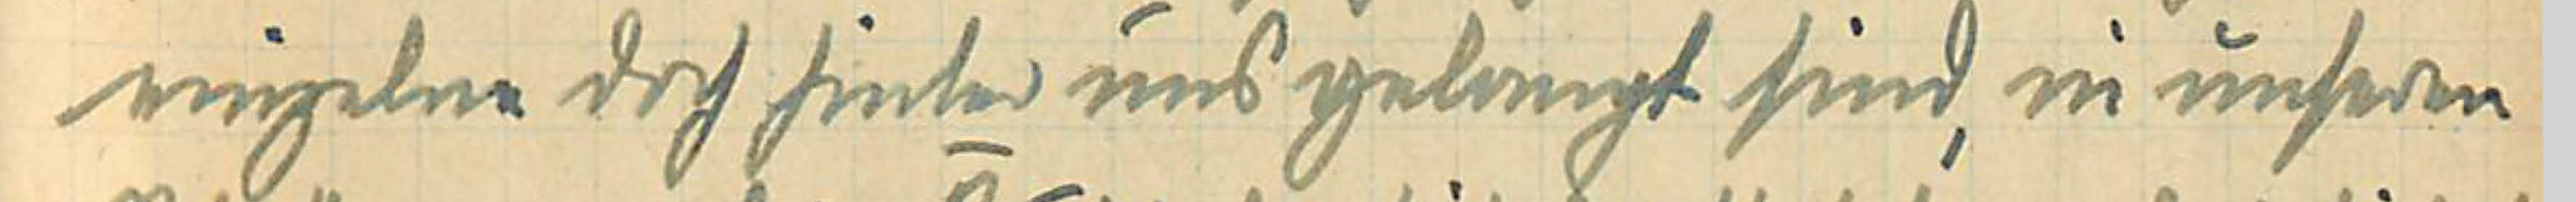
einzelne doch hinter uns gelangt sind, in unseren
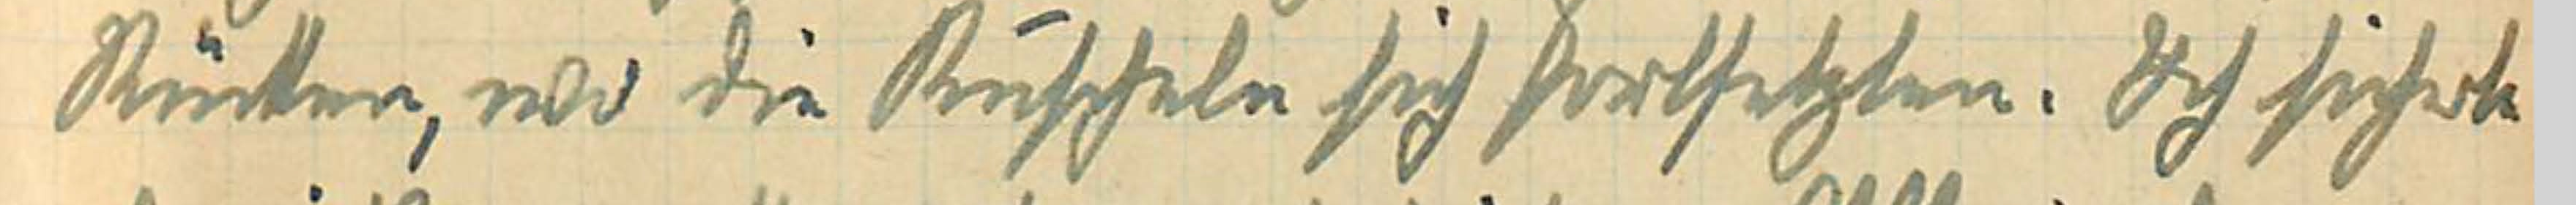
Rücken, wo die Kuscheln sich fortsetzten. Ich sicherte
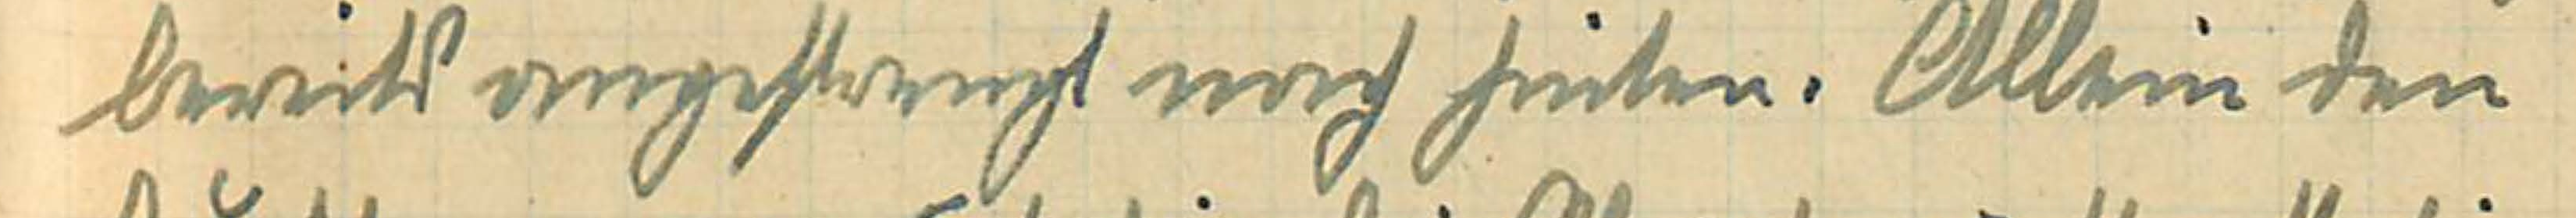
bereits angestrengt nach hinten. Allein den
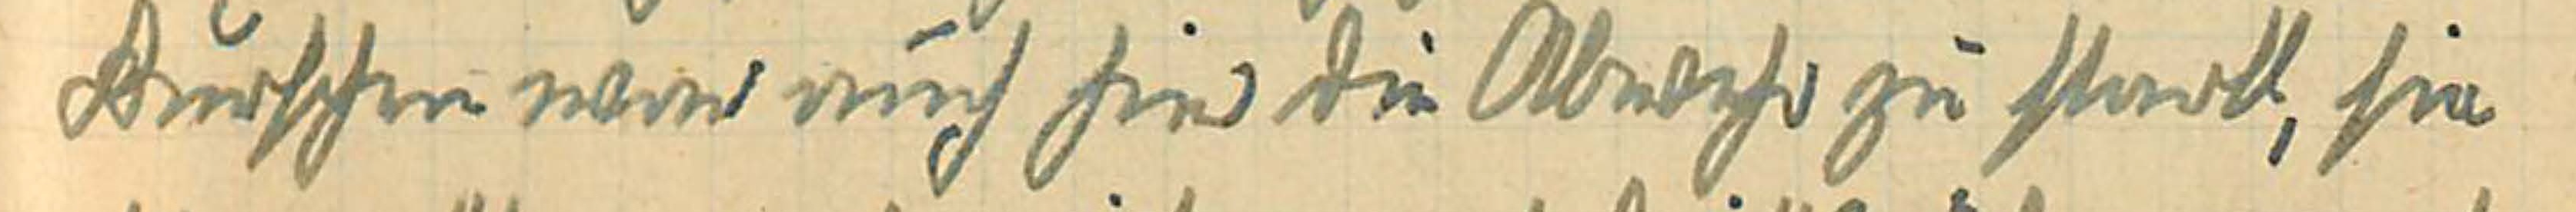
Burschen war auch hier die Abwehr zu stark, sie
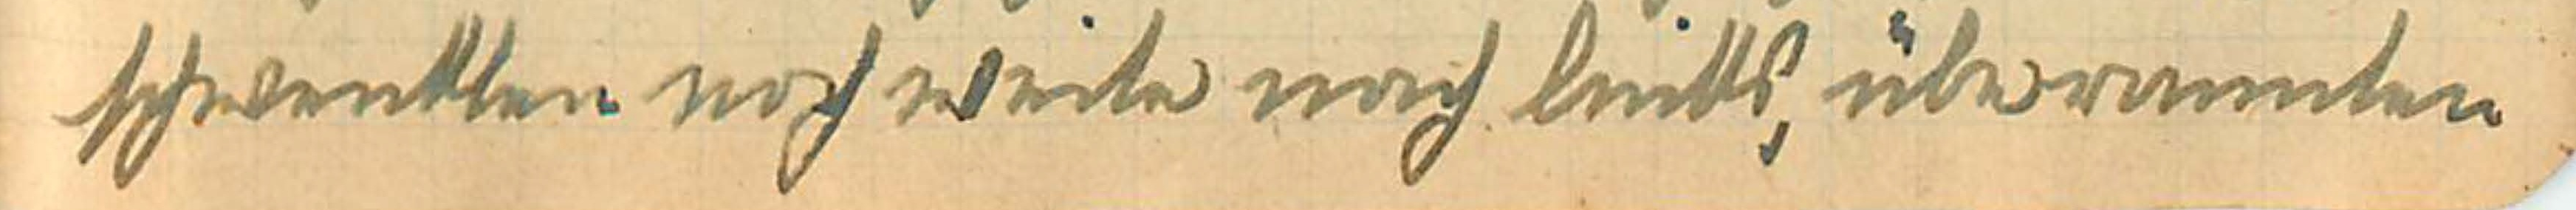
schwenkten noch weiter nach links, überrannten
